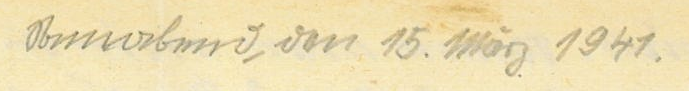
Sonnabend, den 15. März 1941
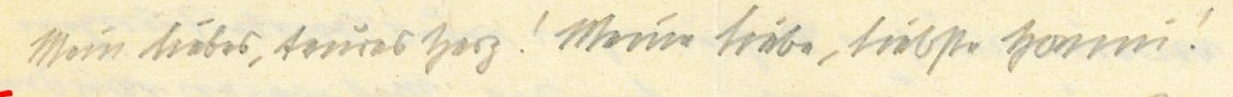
Mein liebes, teures Herz! Meine liebe, liebste !
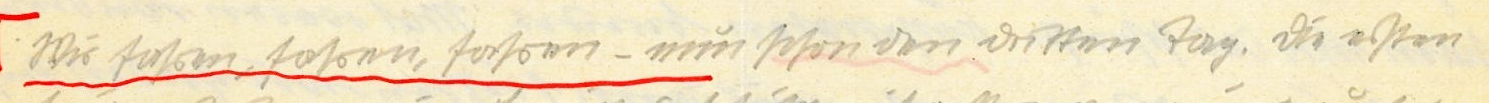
Wir fahren, fahren, fahren – nun schon den dritten Tag. Die ersten
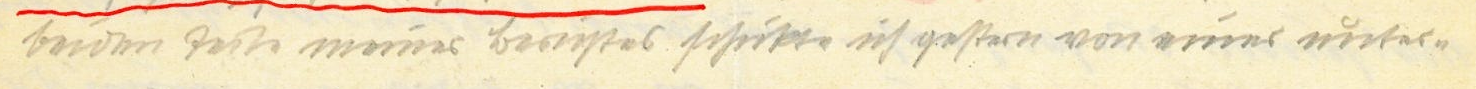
beiden Teile meines Berichtes schickte ich gestern von einer unter¬
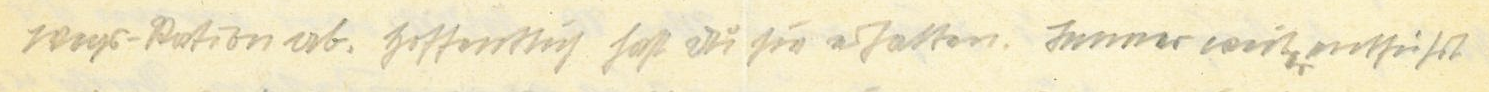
wegs-Station ab. Hoffentlich hast Du sie erhalten. Immer weiter entführt
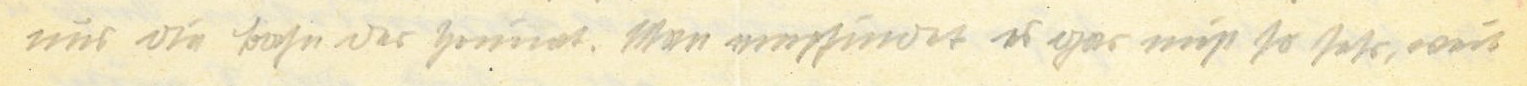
uns die Bahn der Heimat. Man empfindet es gar nicht so sehr, weil
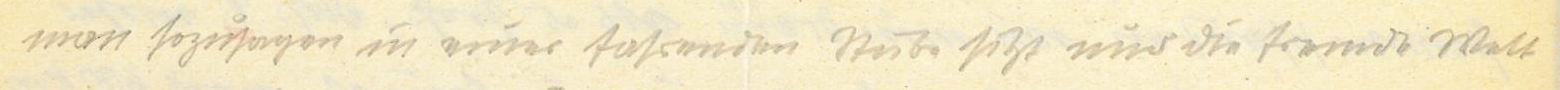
man sozusagen in einer fahrenden Stube sitzt nur die fremde Welt
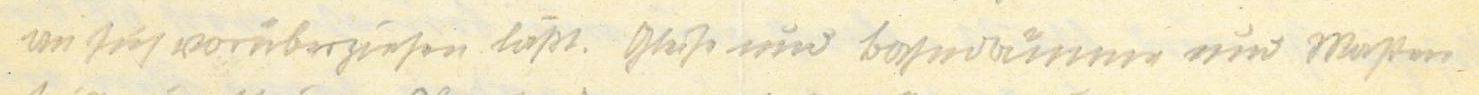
an sich vorbeiziehen läßt. Gleise und Bahndämme und Masten
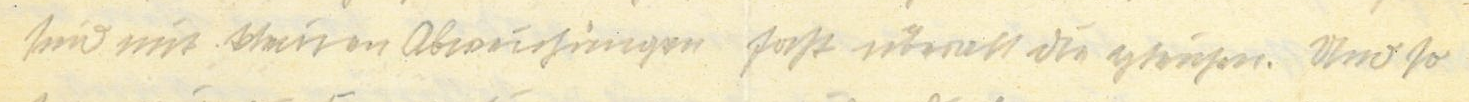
sind mit kleinen Abweichungen fast überall die gleichen. Und so
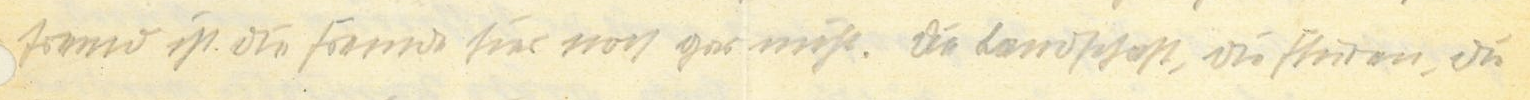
fremd ist die Fremde hier noch gar nicht. Die Landschaft, die Fluren, die
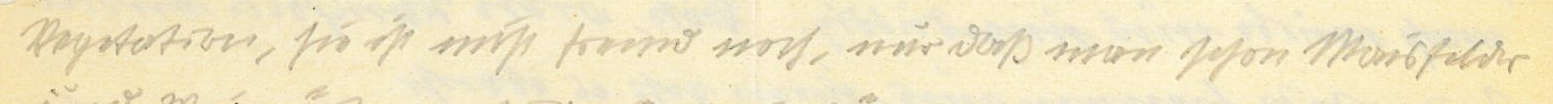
Vegetation, sie ist nicht fremd noch, nur daß man schon Maisfelder
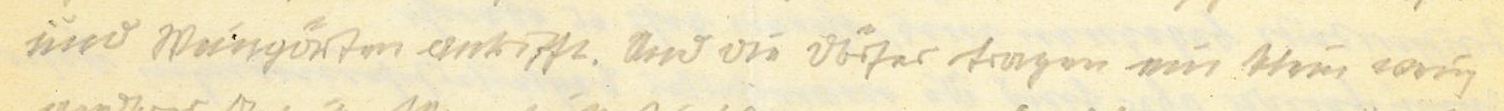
und Weingärten antrifft. Und die Dörfer tragen ein klein wenig
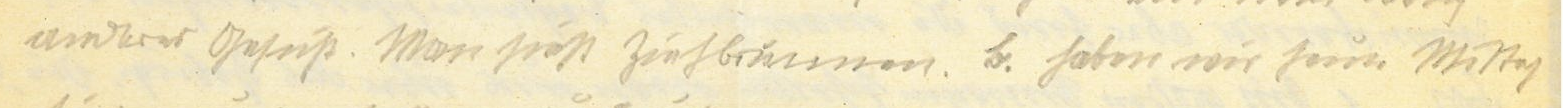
anderes Gesicht. Man sieht Ziehbrunnen. B. haben wir heute Mittag
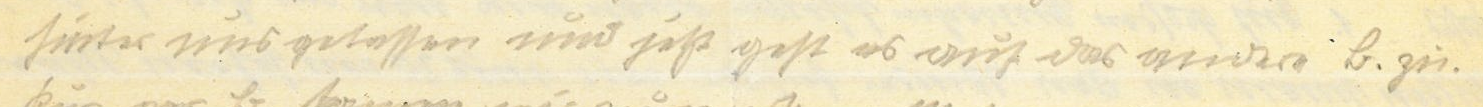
hinter uns gelassen und jetzt geht es auf das andere B. zu.
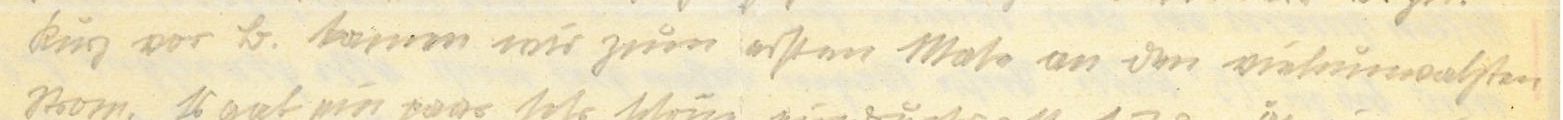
Kurz vor B. kamen wir zum ersten Male an den vielumwalzten
